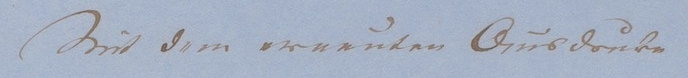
Mit dem erneuten Ausdruke
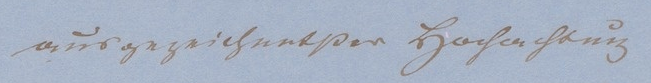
ausgezeichnetster Hochachtung
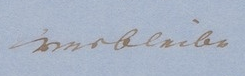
verbleibe
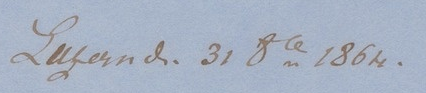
Luzern d. 31 8b 1864.
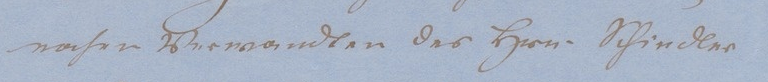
nahen Verwandten des Hrn. Schindler
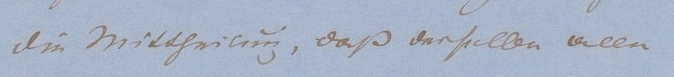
die Mittheilung, daß derselbe alle
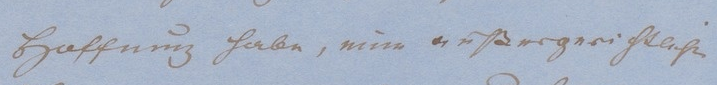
Hoffnung habe, eine außergerichtliche
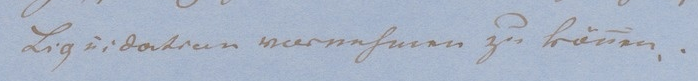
Liquidation vornehmen zu können.
